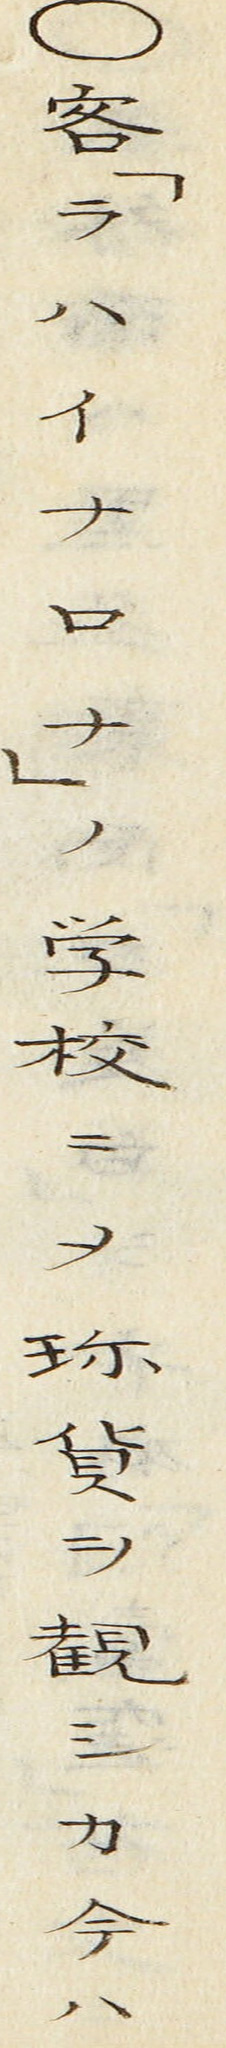◯客「ラハイナロナ」ノ学校ニシテ珎貨ヲ観シカ今ハ
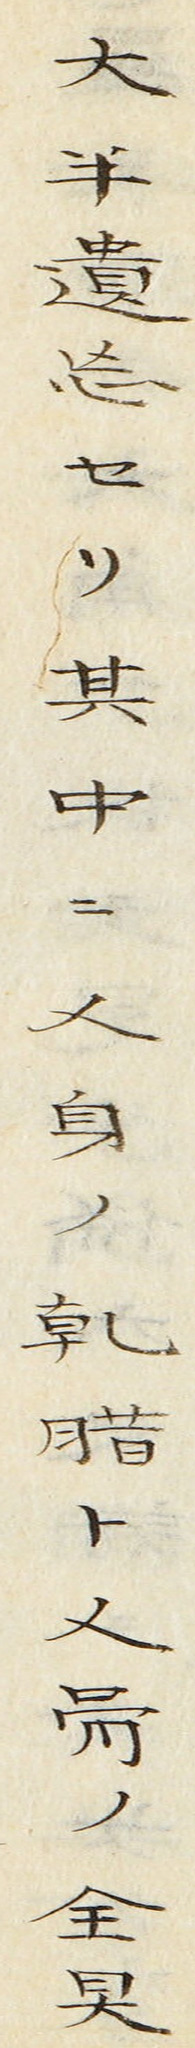大半遺忘セリ其中ニ人身ノ乹腊ト人骨ノ全旲
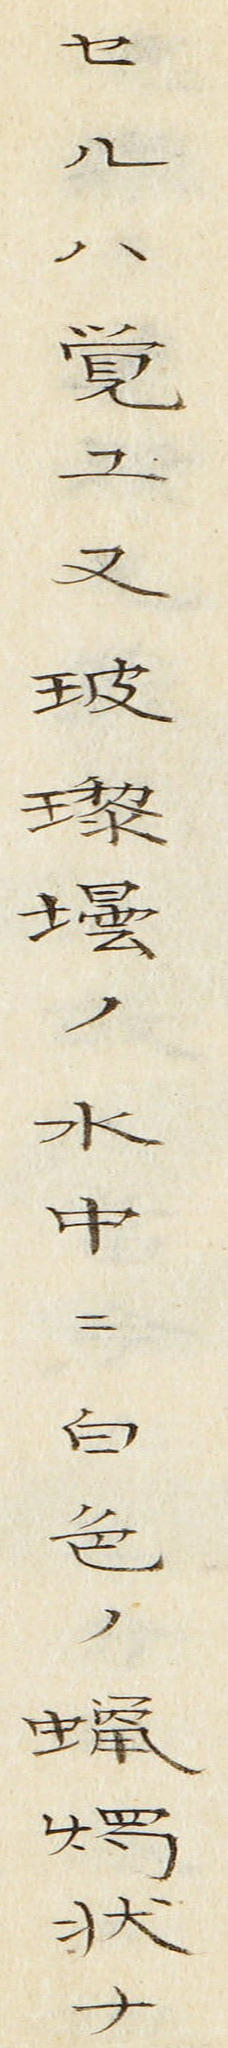セルハ覚ユ又玻瓈壜ノ水中ニ白色ノ蝋燭状ナ
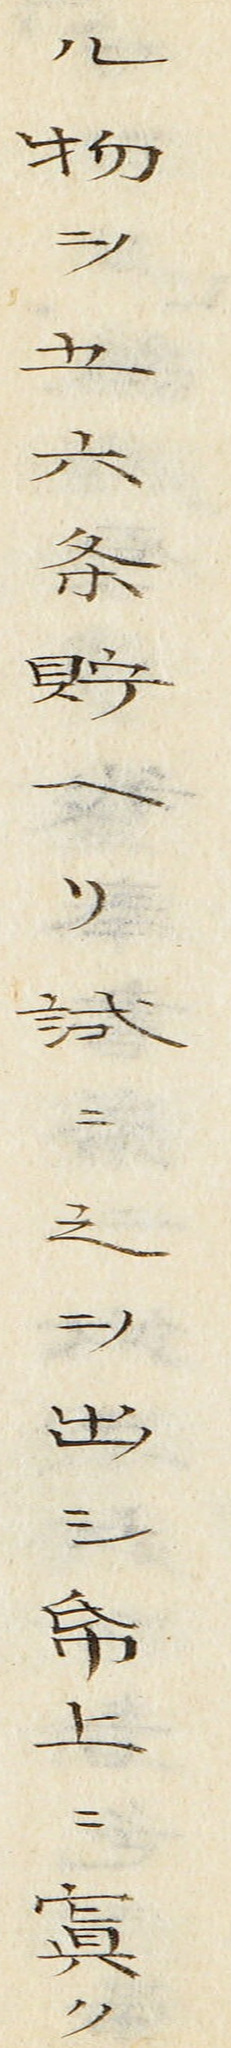ル物ヲ五六条貯ヘリ試ニ之ヲ出シ帋上ニ寘ク
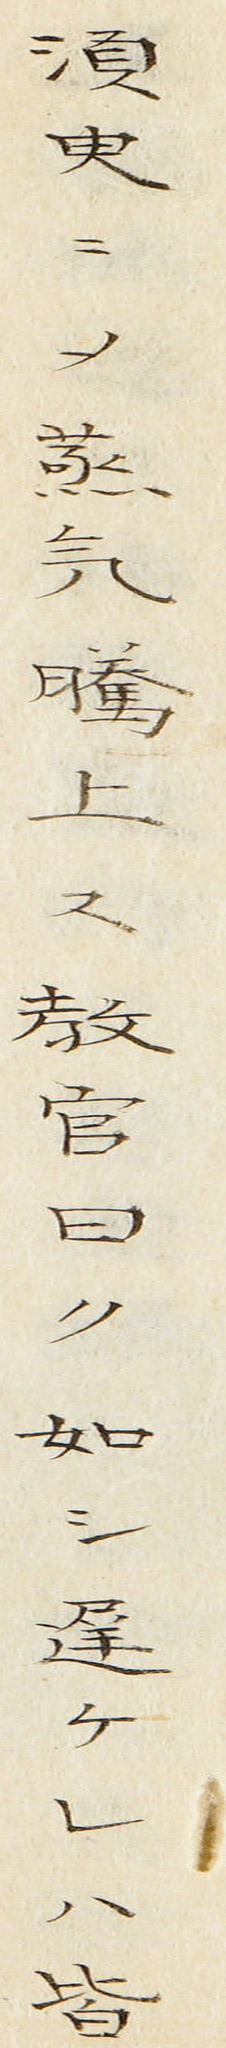須臾ニシテ蒸気騰上ス教官曰ク如シ遅ケレハ皆
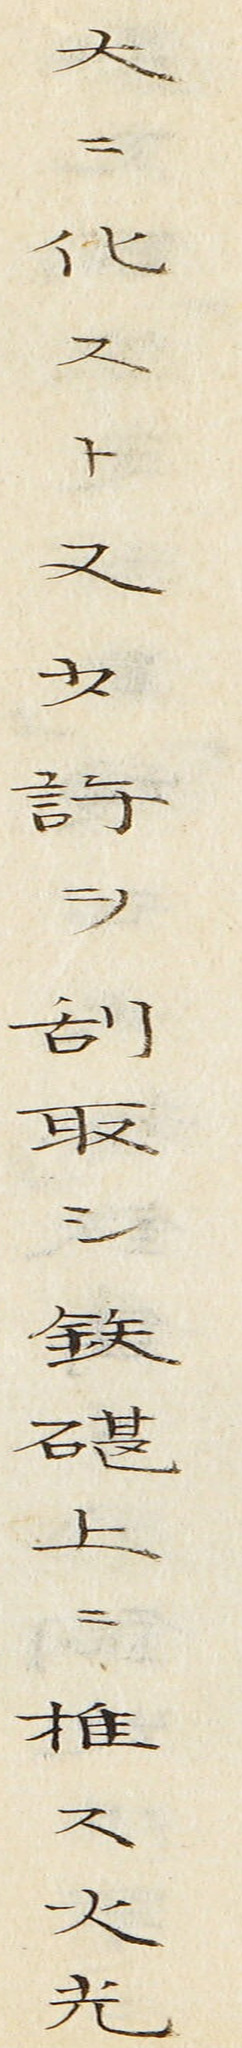大ニ化スト又少許ヲ刮取シ鉄碪上ニ推ス火光
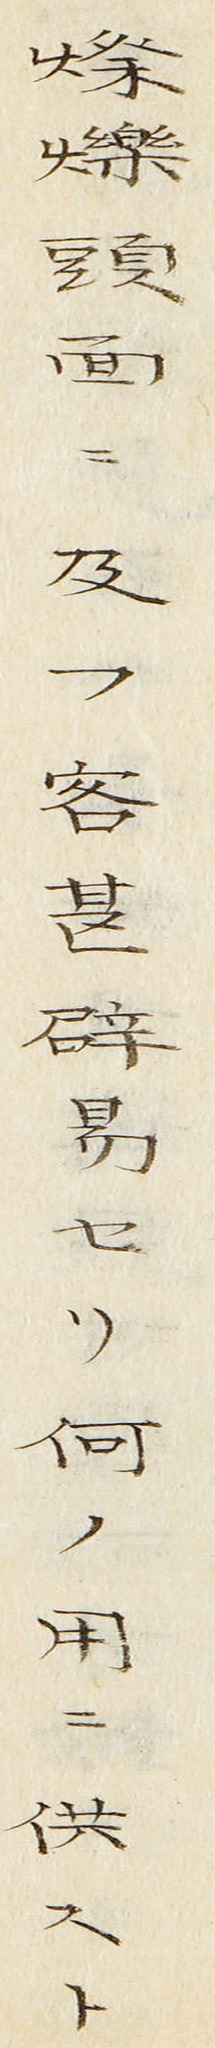燦？爍頭面ニ及フ客甚辟易セリ何ノ用ニ供スト
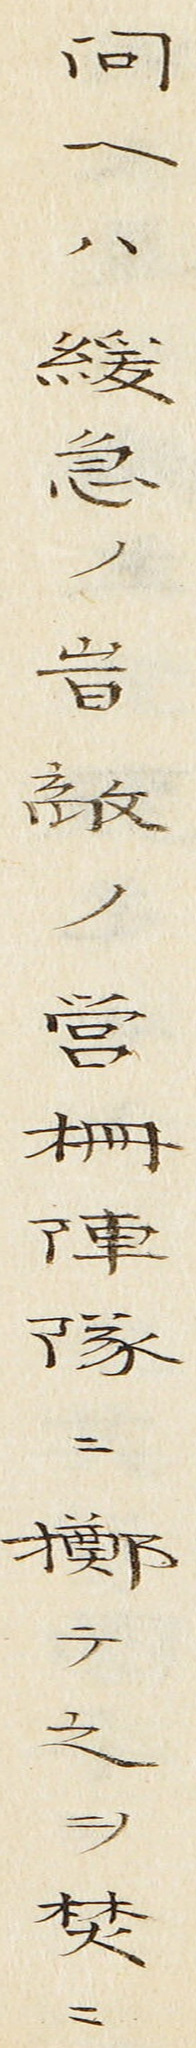問ヘハ緩急ノ旹敵ノ営柵陣隊ニ擲テ之ヲ焚ニ
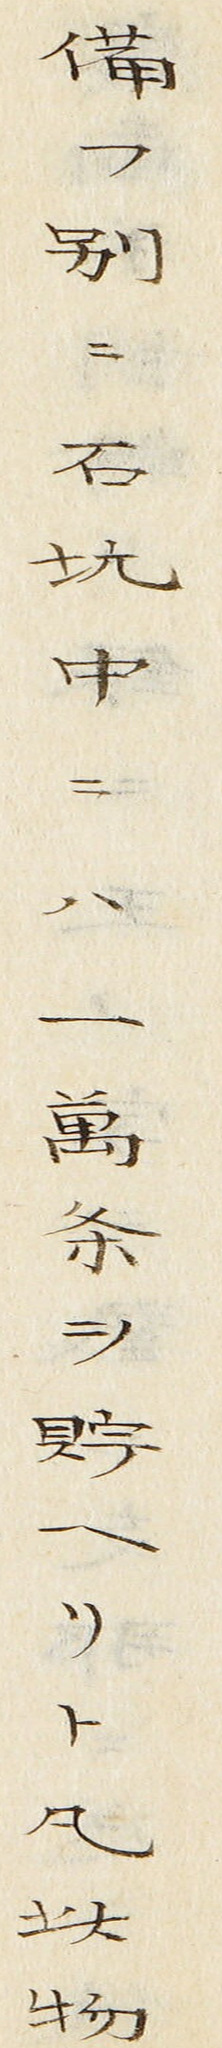備フ別ニ石杭中ニハ一萬条ヲ貯ヘリト凡此物
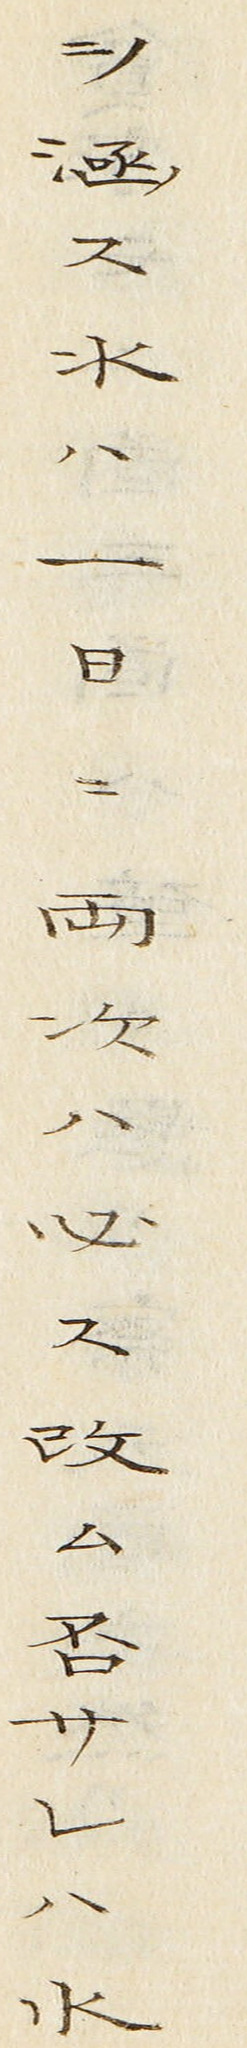ヲ涵ス水ハ一日ニ両次ハ必ス改ム否サレハ水
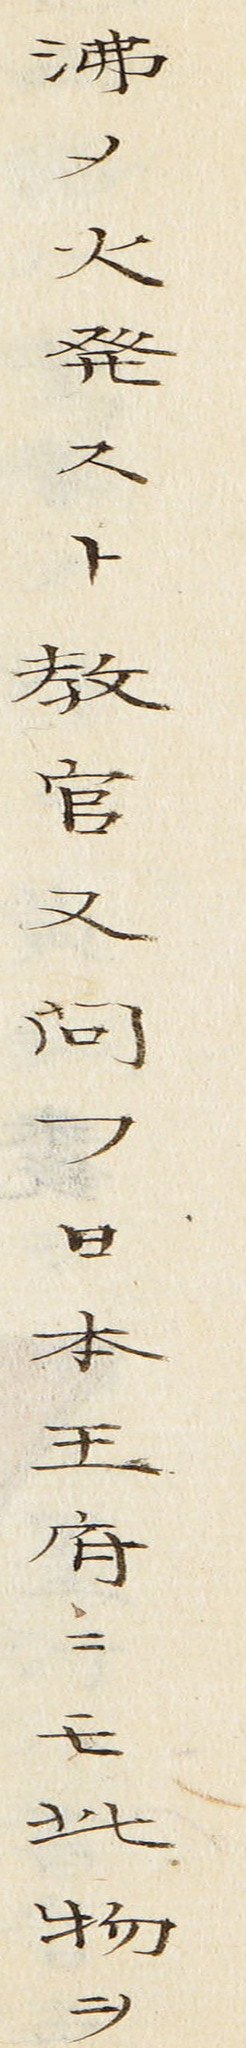沸シテ火発スト教官又問フ日本王府ニモ此物ヲ
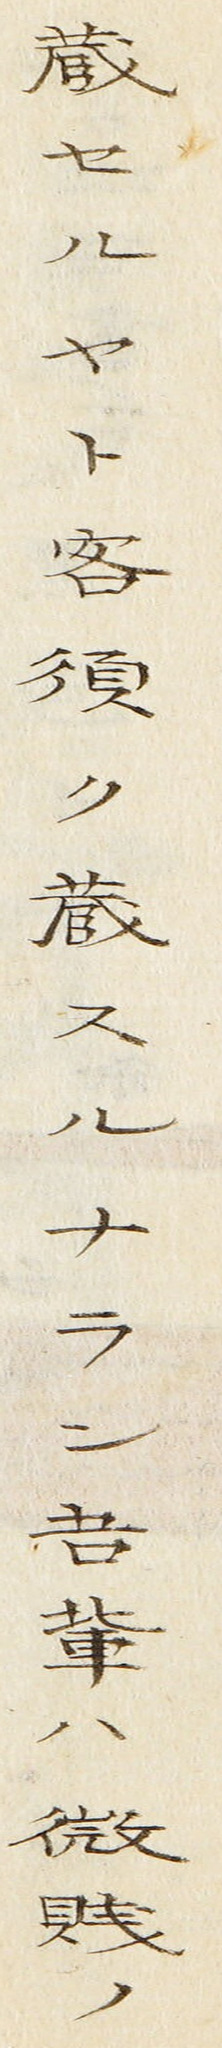蔵セルヤト客須ク蔵スルナラン吾輩ハ微賤ノ
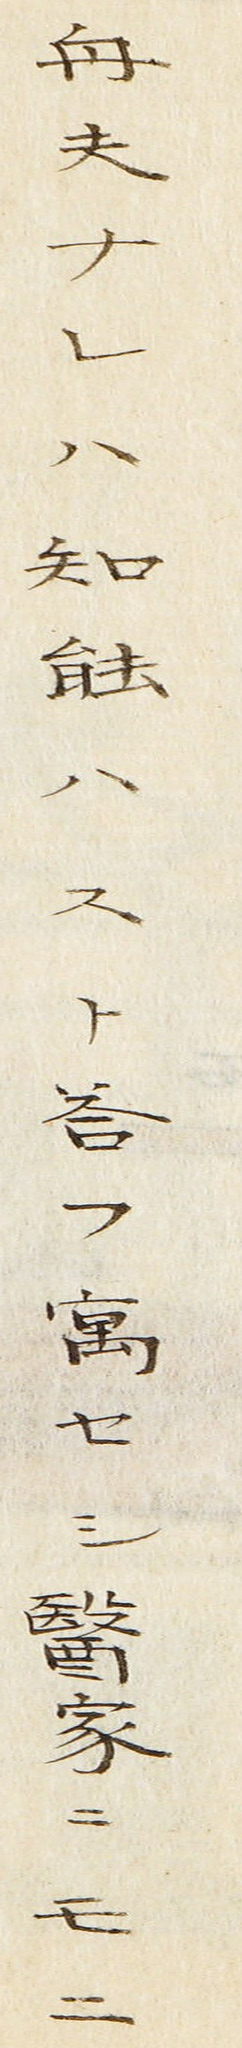舟夫ナレハ知䏻ハスト答フ寓セシ医家ニモ二
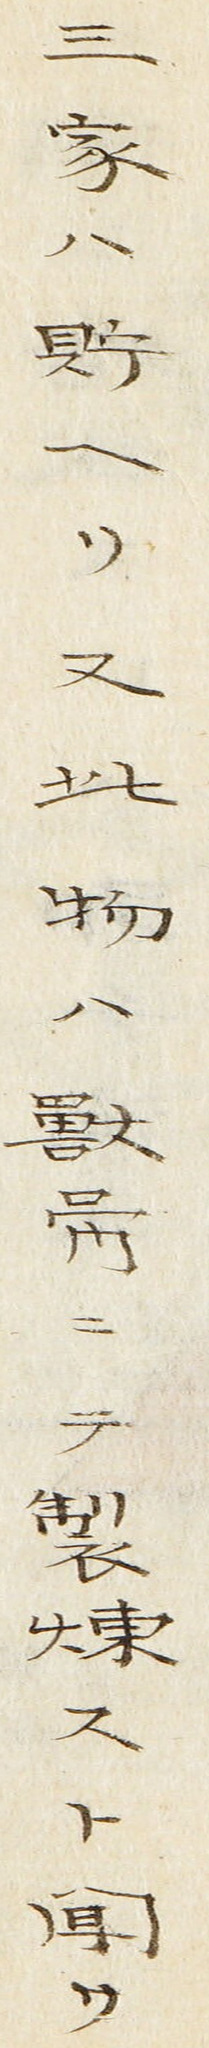三家ハ貯ヘリ又此物ハ獣骨ニテ製煉スト聞ク
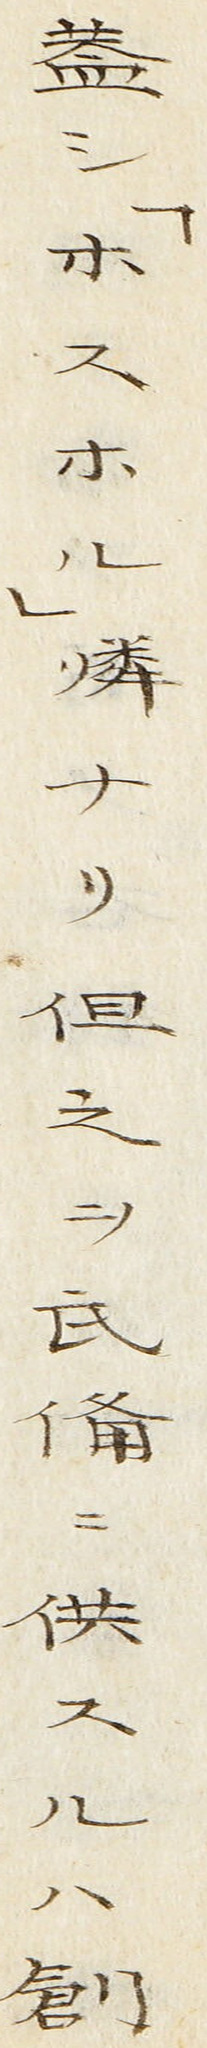蓋シ「ホスホル」燐ナリ但之ヲ武？脩ニ供スルハ創
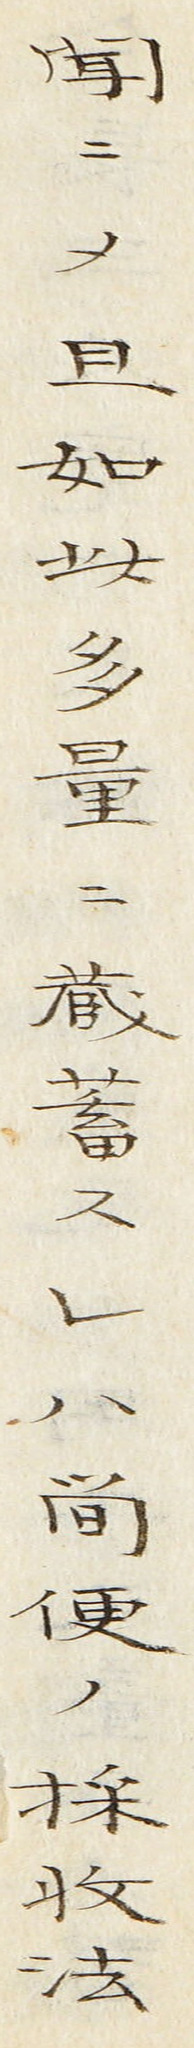聞ニシテ且如此多量ニ蔵蓄スレハ簡便ノ採収法
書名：蕃談
